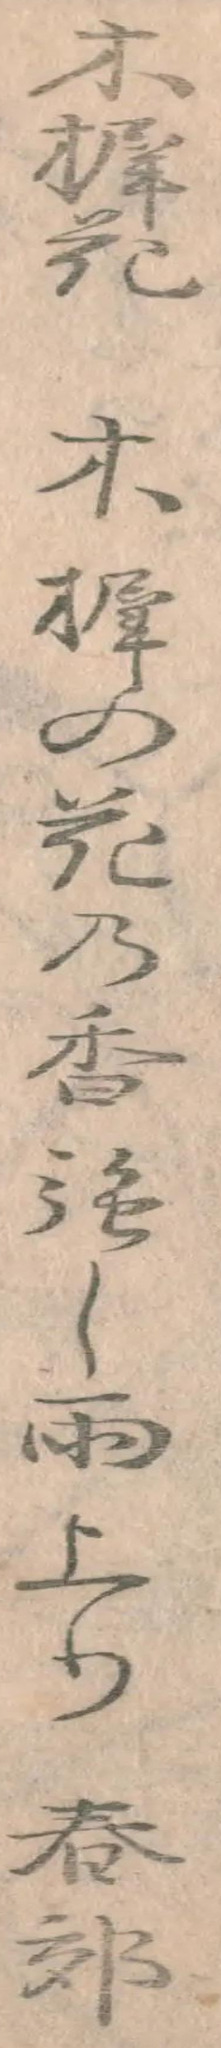木樨花木樨の花の香強し雨上り春郊
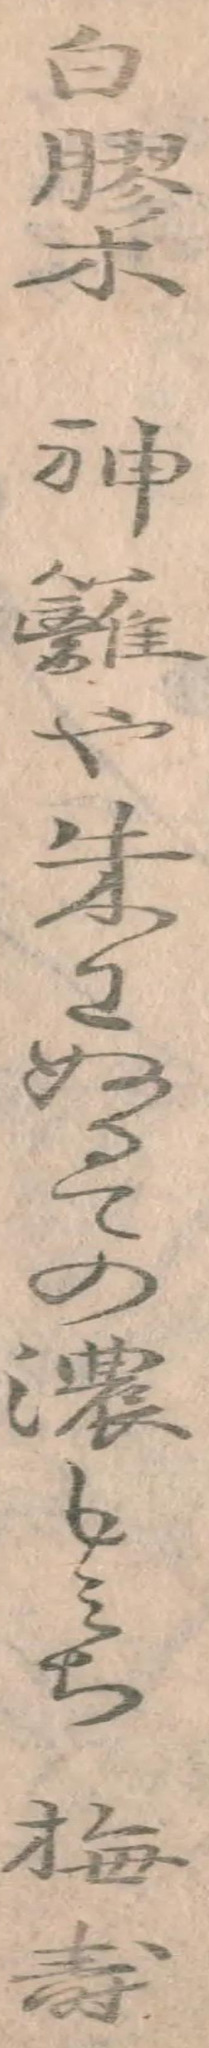白膠木神籬や朱にぬるての濃もみち梅壽
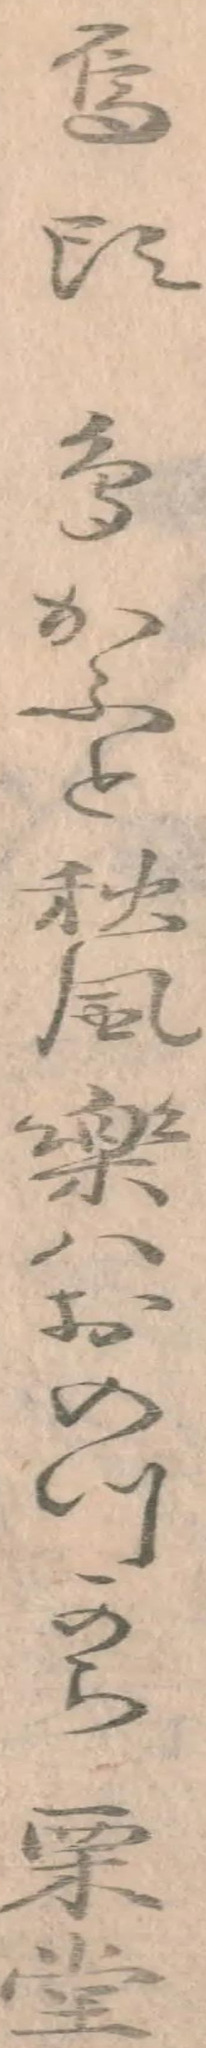烏頭鳥かふと秋風楽はおのつから栗堂
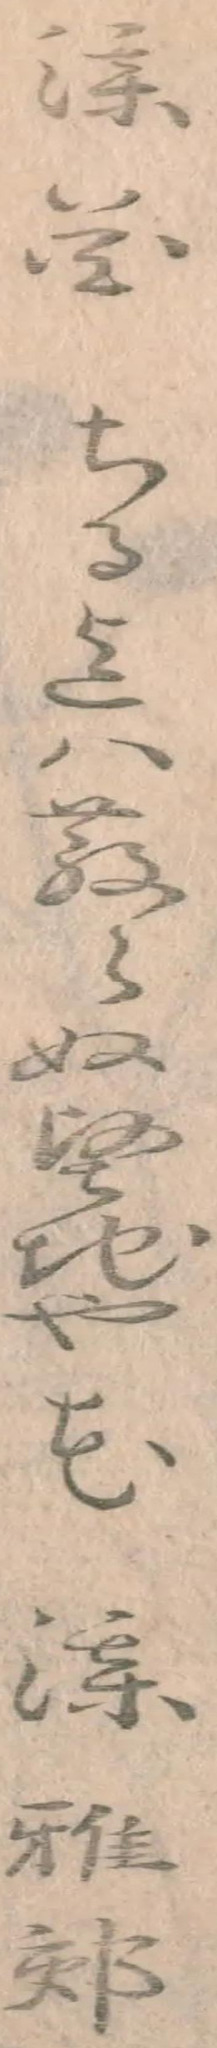漆花ちる迄は散らぬ堅地や花漆雅郊
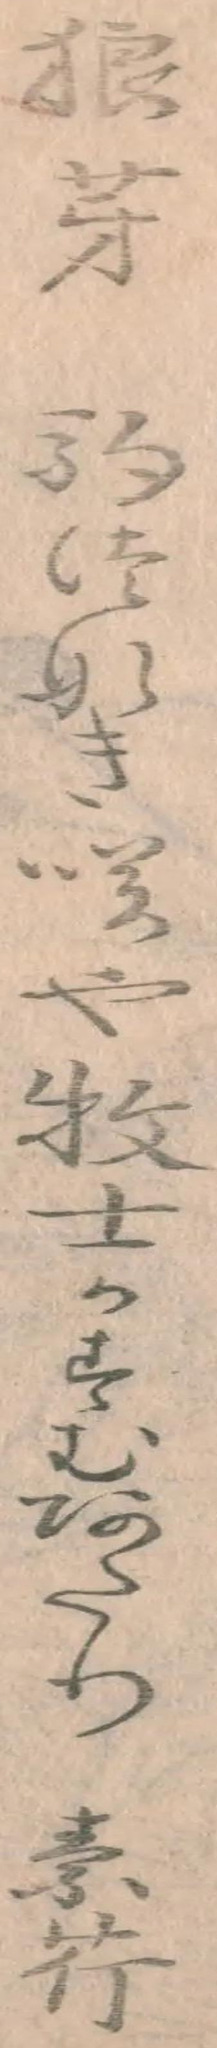狼芽駒つなき咲や牧士かすむあたり素芹
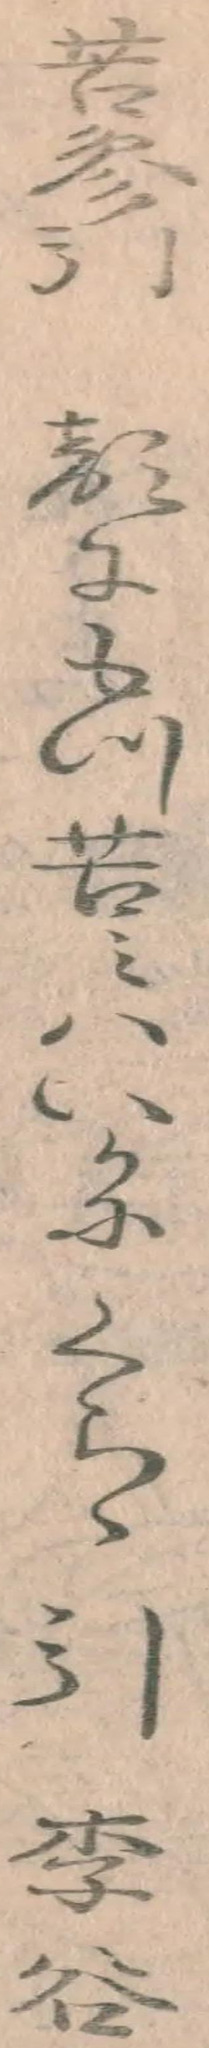苦参引顔にもつ苦みはいかにくらゝ引李谷
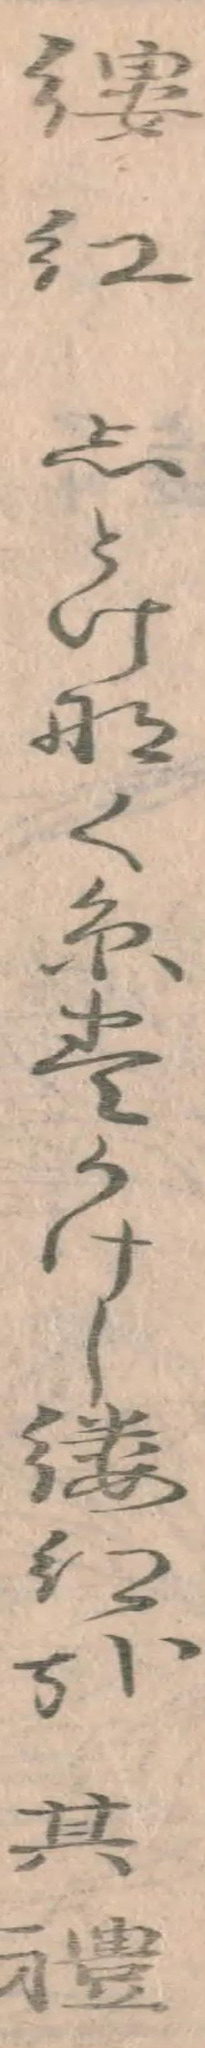縷紅しとけなく糸巻かけし縷紅哉其禮
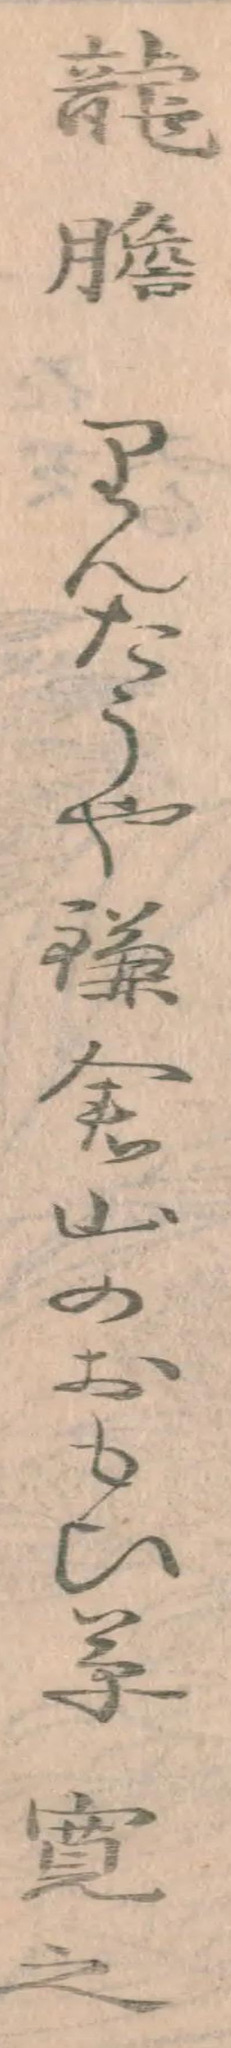竜胆りんたうや鎌倉山のおもひ草寛之
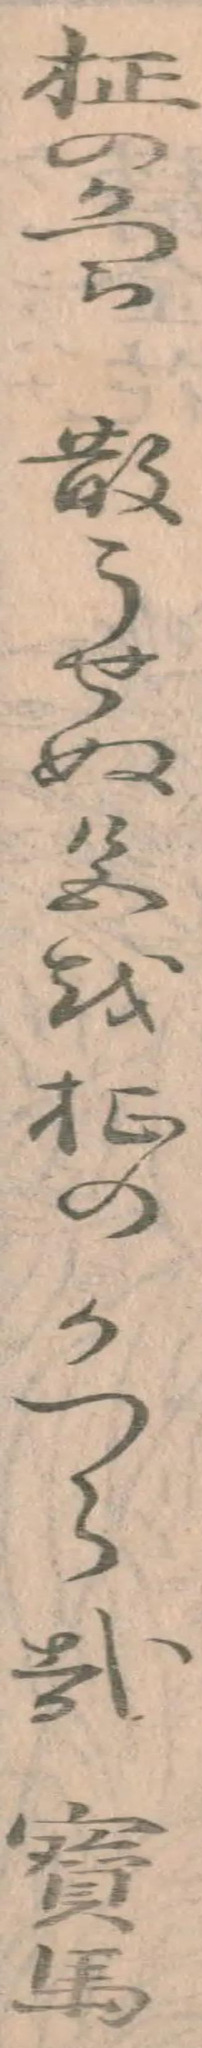柾のかつら散うせぬ色を柾のかつら哉寶馬
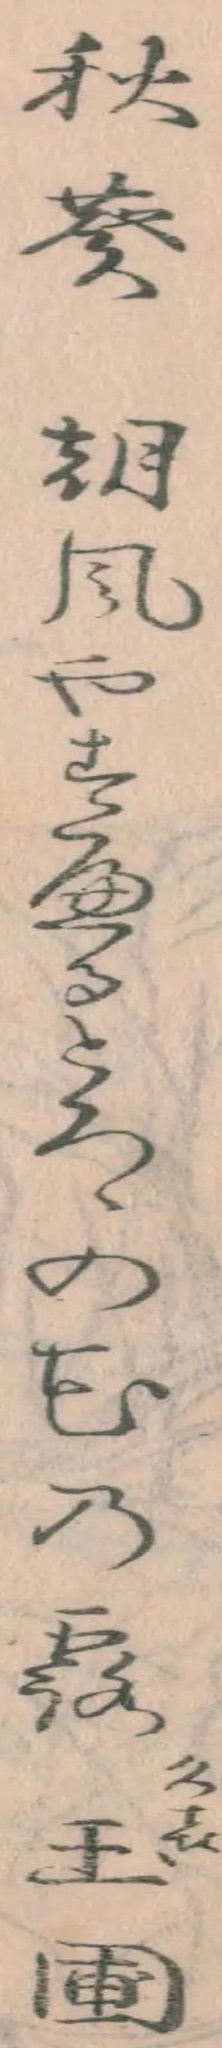秋葵朝風やすへるとろゝの花の露久喜玉圃
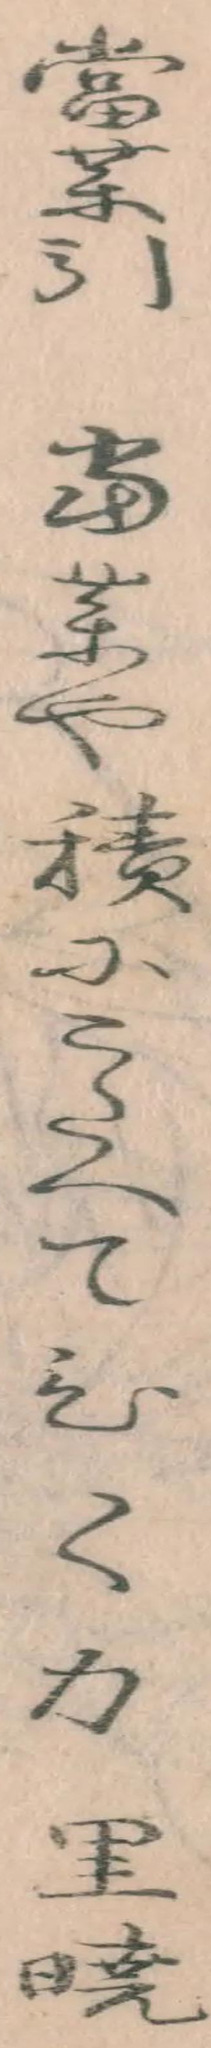当薬引当薬や積にこたへてひく力里暁
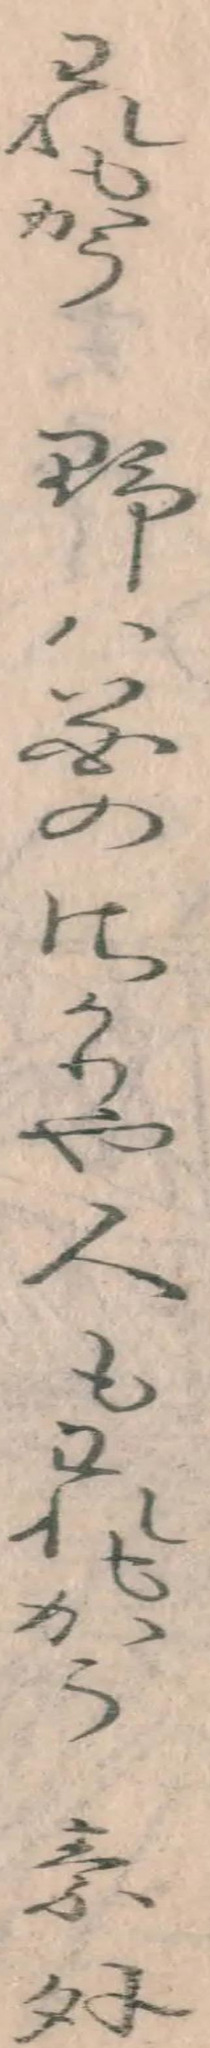われもかう野は花のさかりや人もわれもかう素外
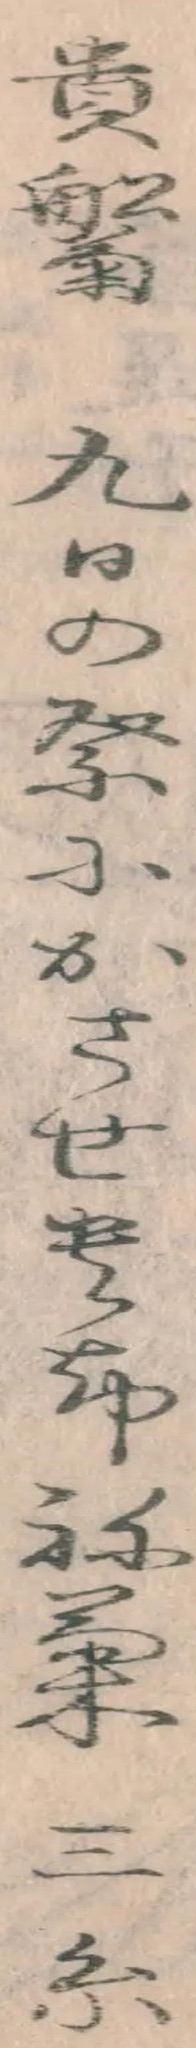貴船菊九日の祭にかさせ貴ふね菊三糸
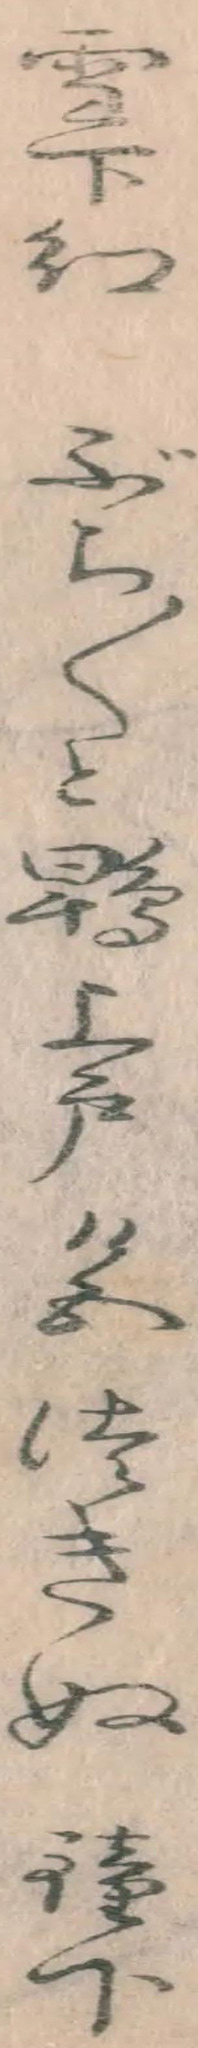雪下紅ぶら〳〵と鵯上戸色つきぬ鐘下
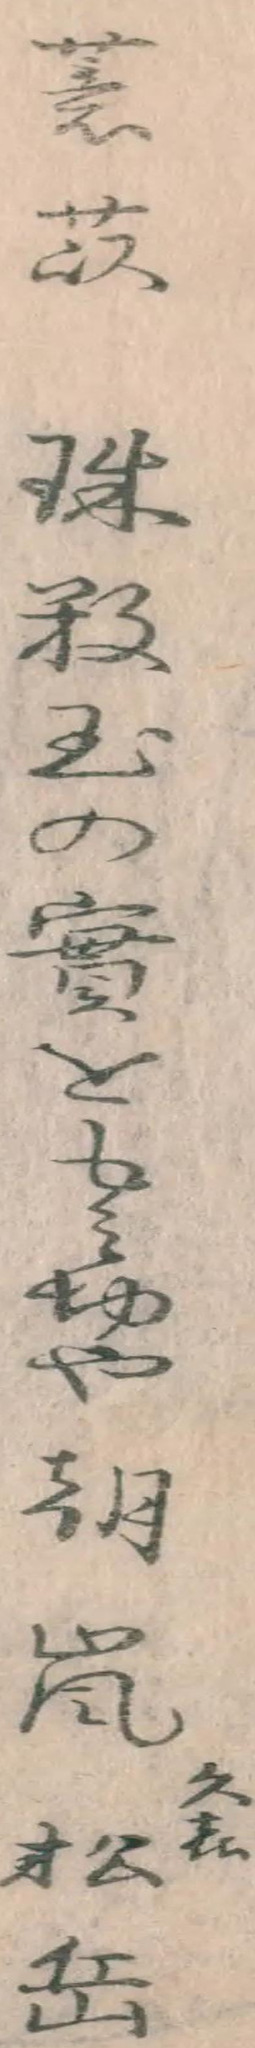薏苡珠数玉の実をもみ切や朝嵐久喜松岳
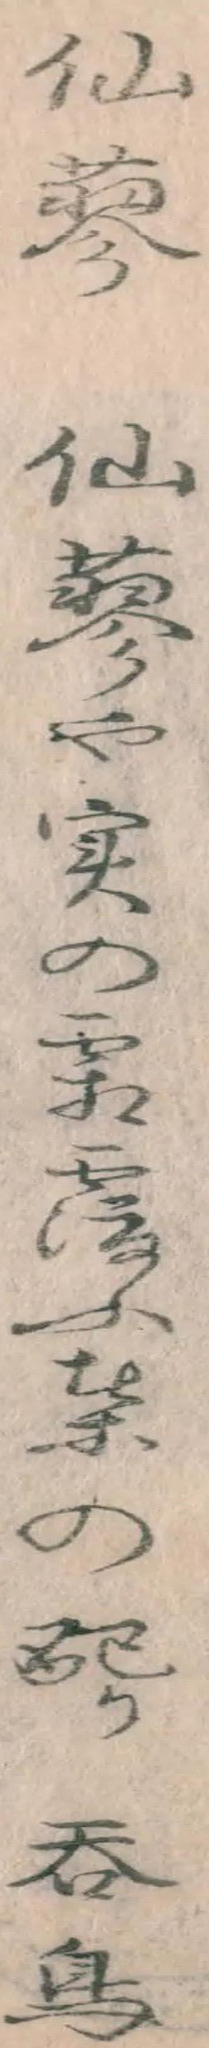仙蓼仙蓼や実の霜覆ふ葉の配り呑鳥
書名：誹諧名知折 2巻. [2]
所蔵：国立国会図書館 National Diet Library, JAPAN
